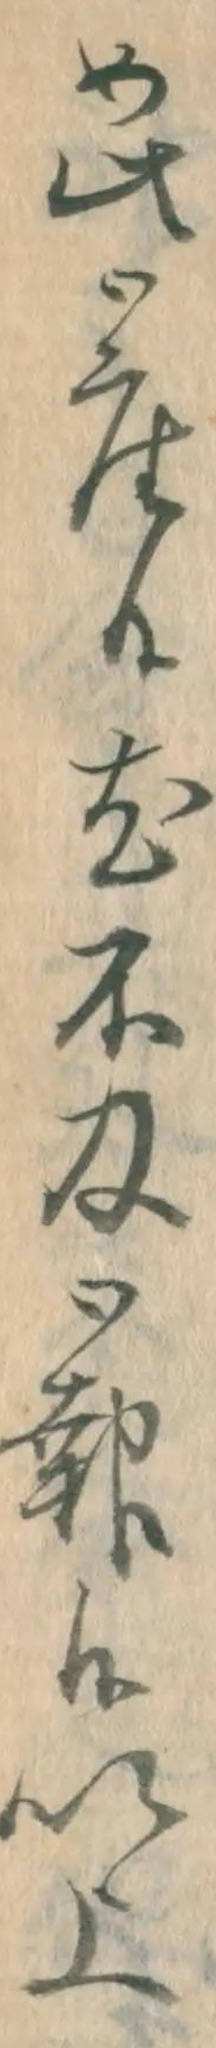如此御座候尤不及御報候以上

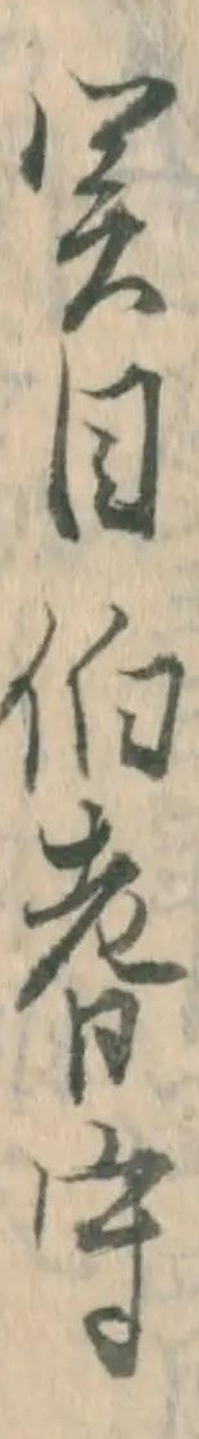関目伯耆守
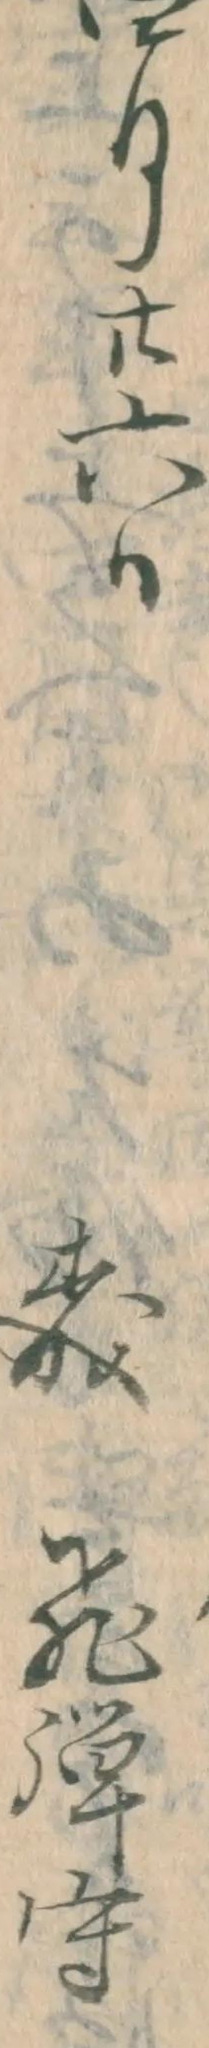四月廿六日森飛騨守
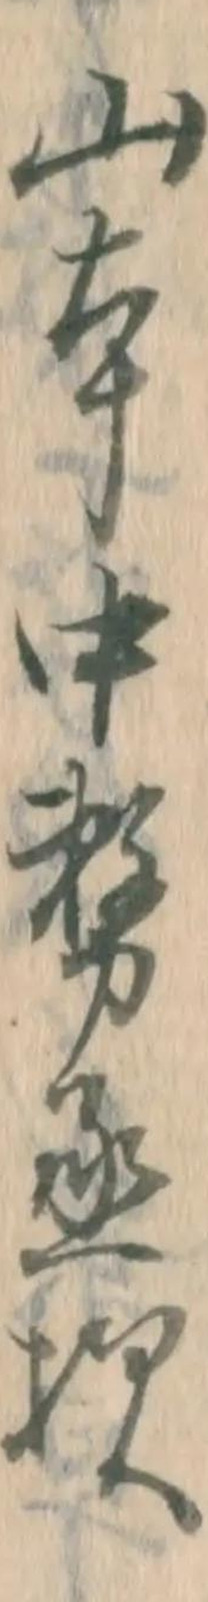山本中務丞様
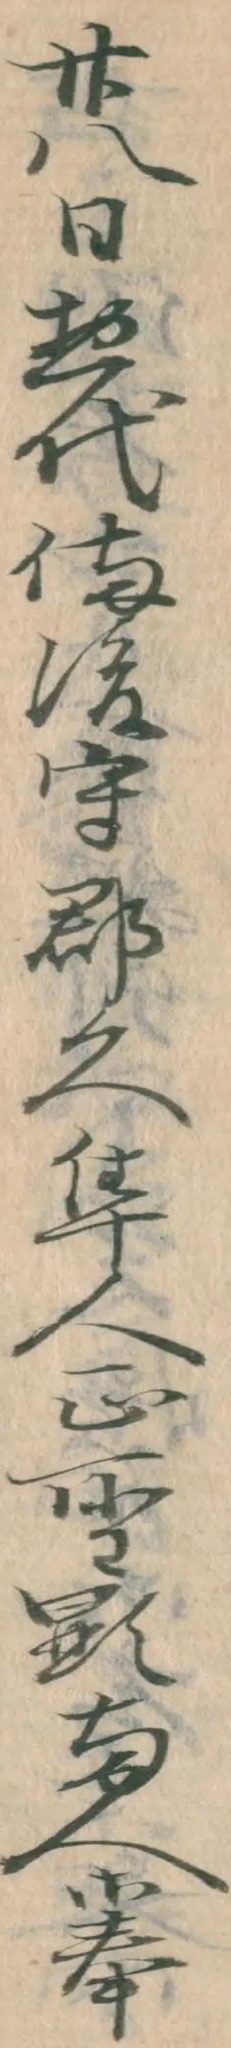廿八日惣代備後守郡久隼人正聖顕両人御奉
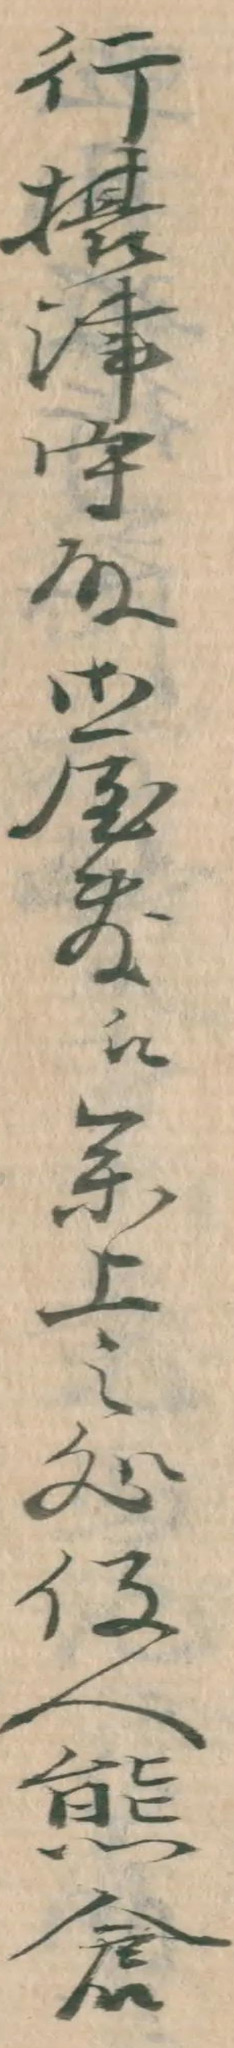行摂津守殿御屋敷江参上之処役人熊倉
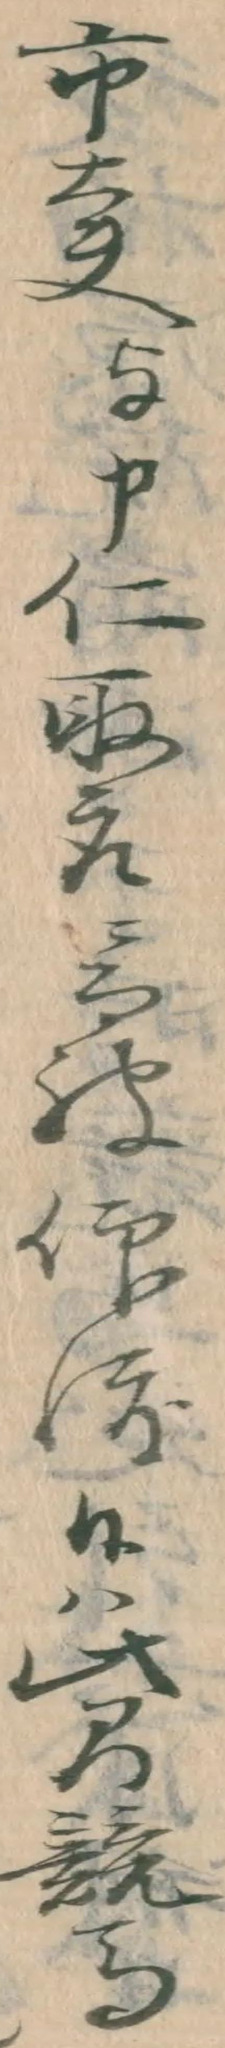市大夫与申仁取取ニ而被仰渡候ハ此間競馬
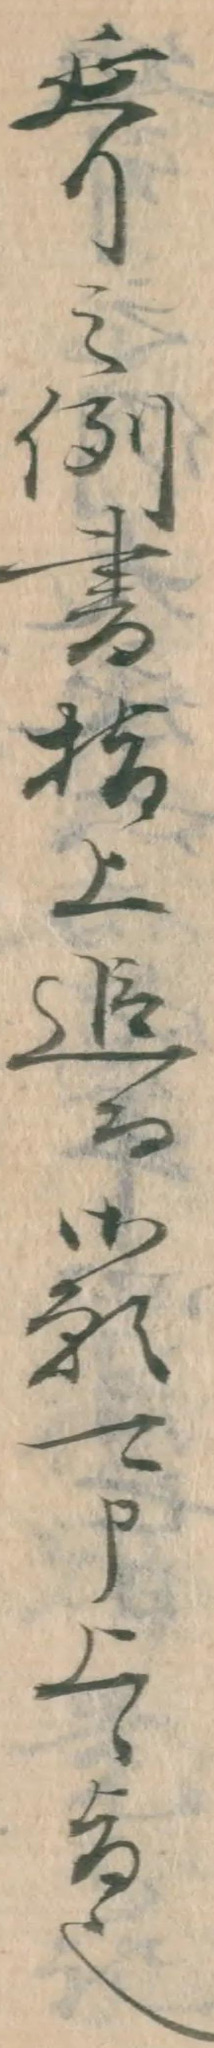延行之例書指上追而御願可申上候旨也
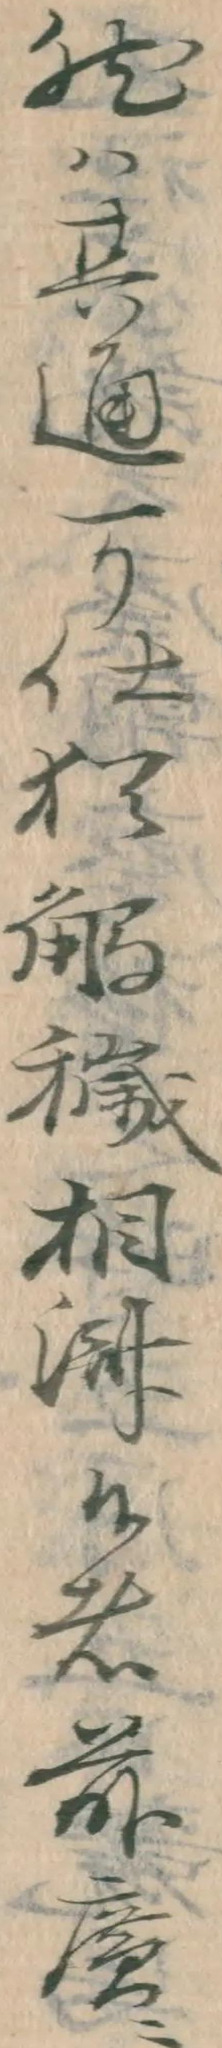然ハ其通可仕猶触穢相済候者前広ニ
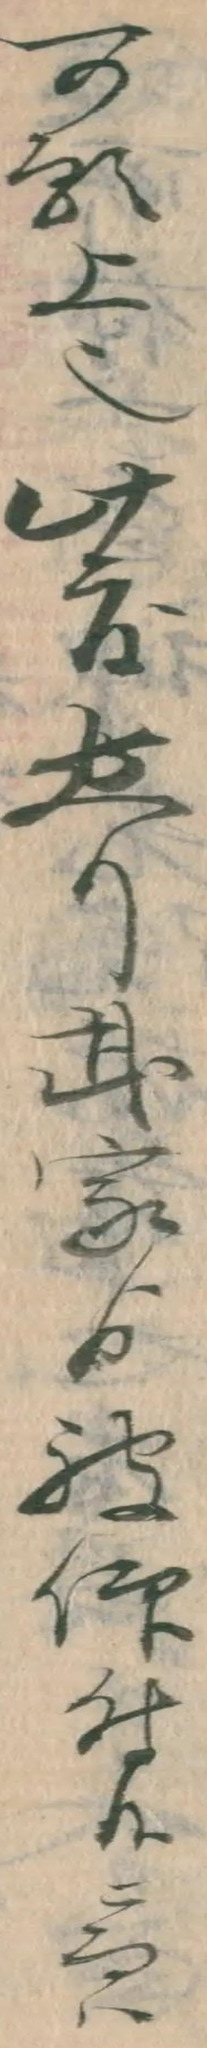可願上也此度延引武家ゟ被仰付候ニ而ハ
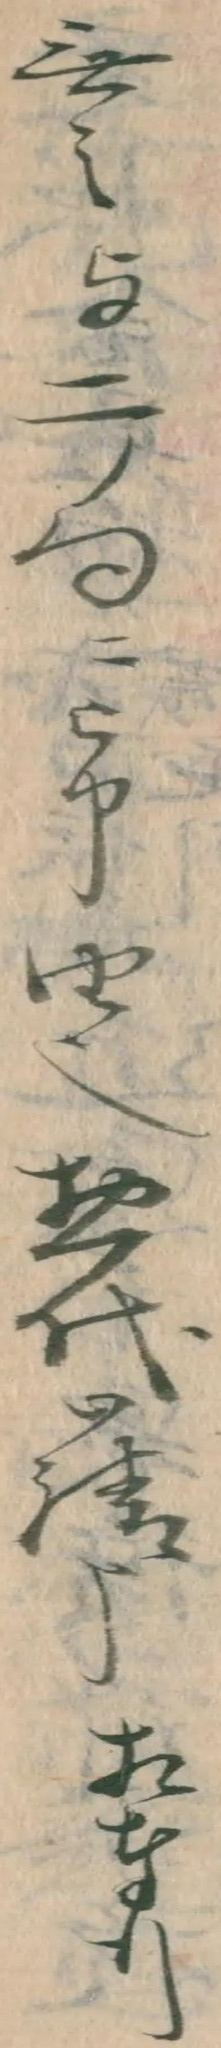無之与二ノ句ニ被申由也惣代御請申相奉行
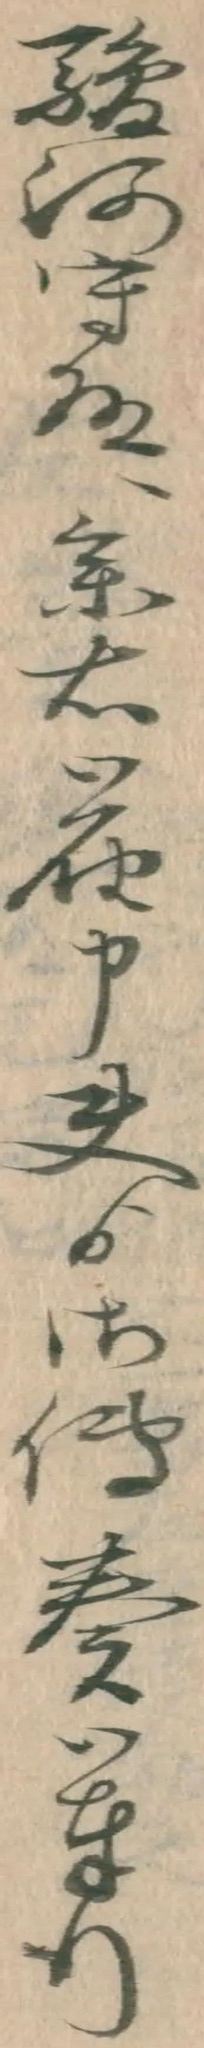駿河守殿へ参右御届申夫ゟ御伝奏御奉行
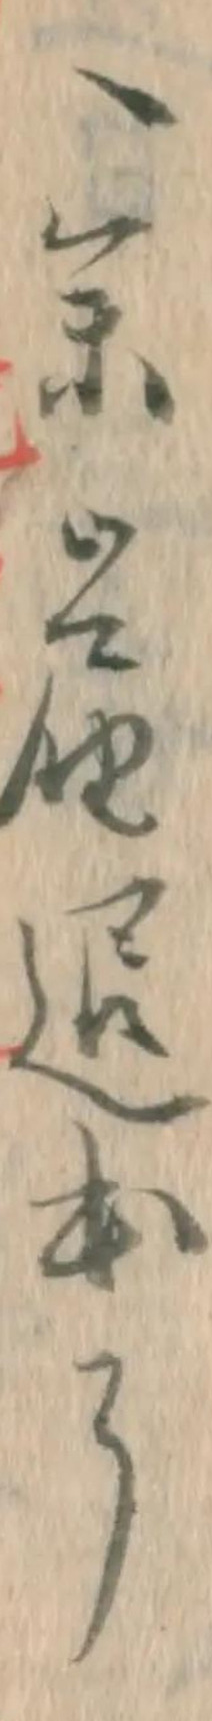へ参御届退出了
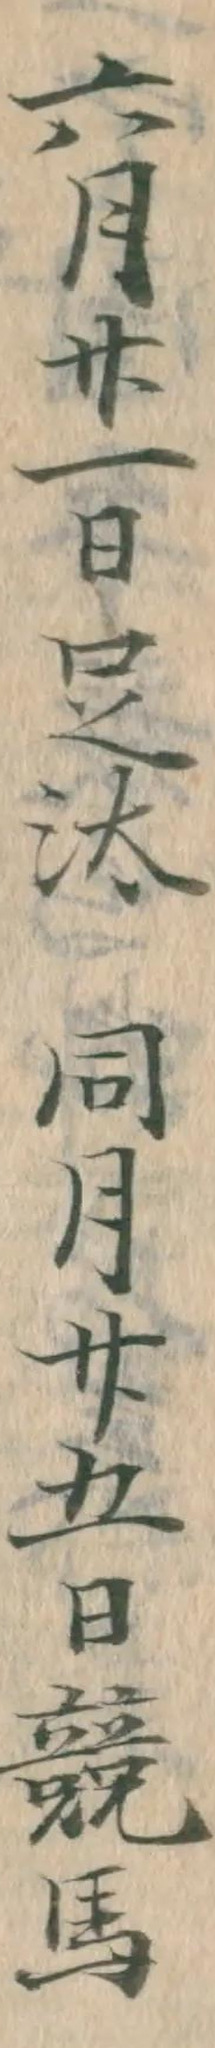六月廿一日足汰同月廿五日競馬
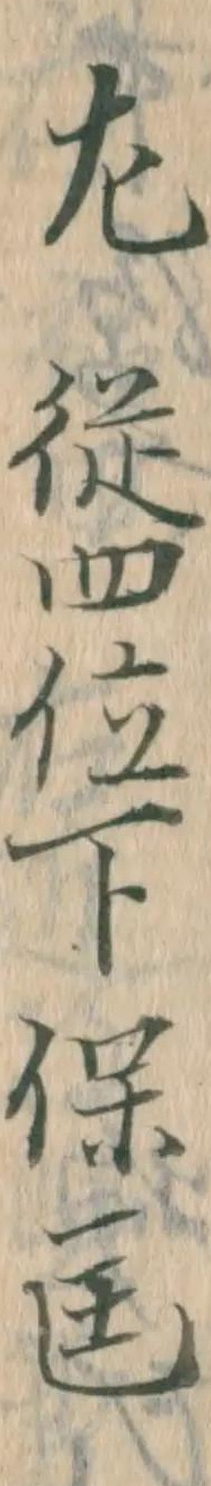左従四位下保匡
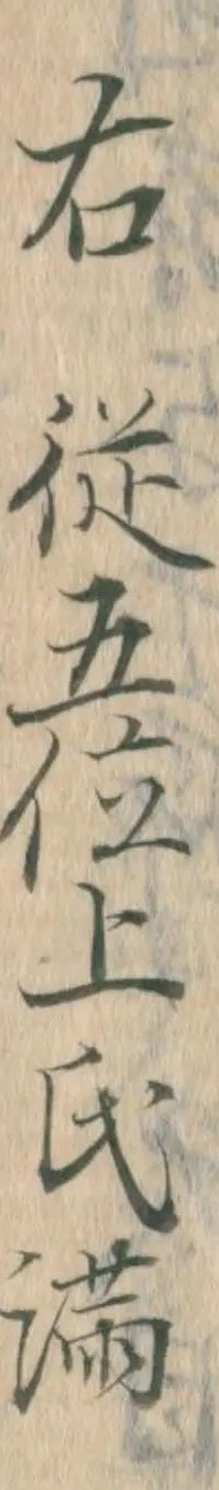右従五位上氏満
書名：賀茂社記録. 第10冊
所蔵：国立国会図書館 National Diet Library, JAPAN
